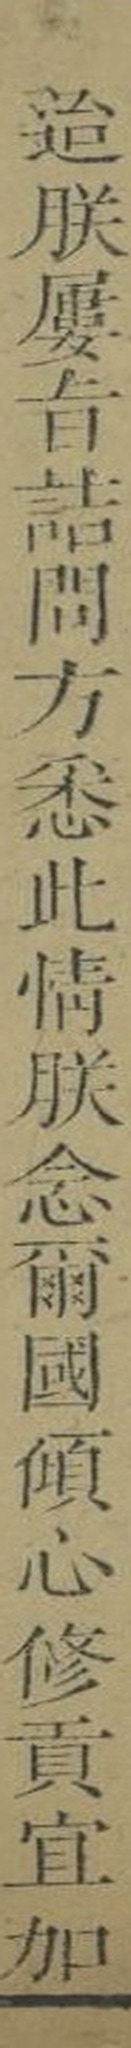迨朕屢旨詰問方悉此情朕念爾国傾心修貢宜加
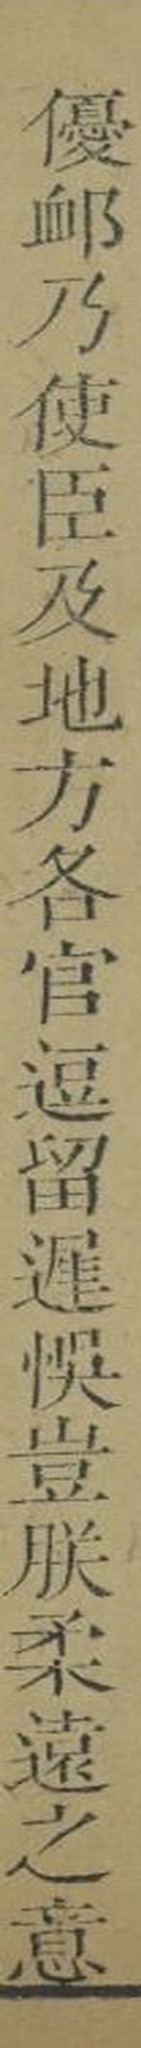優恤乃使臣及地方各官逗留遅悞豈朕柔遠之意
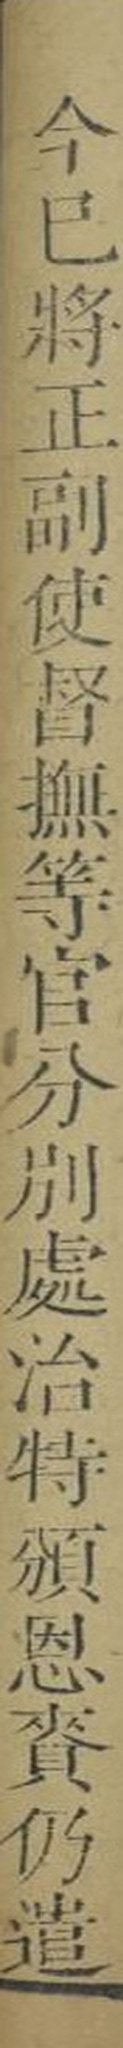今巳将正副使督撫等官分別処治特頒恩賚仍遣
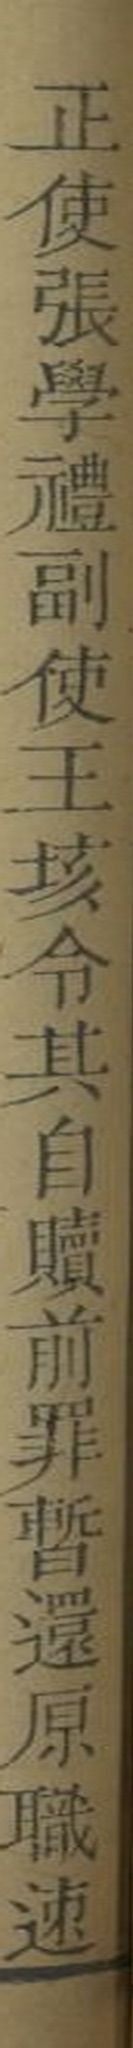正使張学礼副使王垓令其自贖前罪暫還原職速
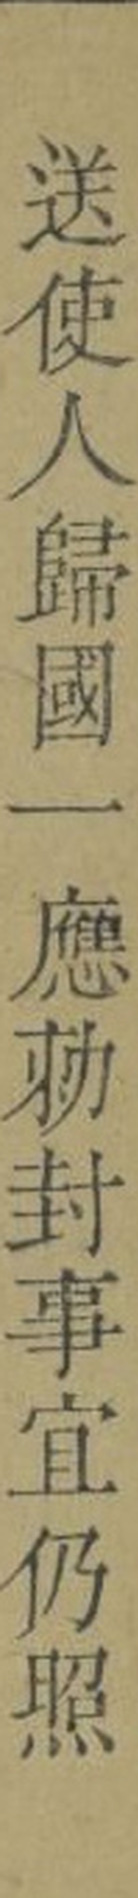送使人帰国一応勅封事宜仍照
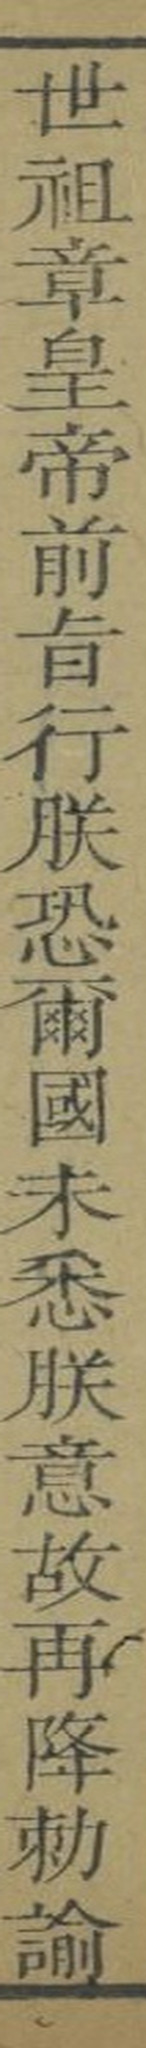世祖章皇帝前旨行朕恐爾国未悉朕意故再降勅諭
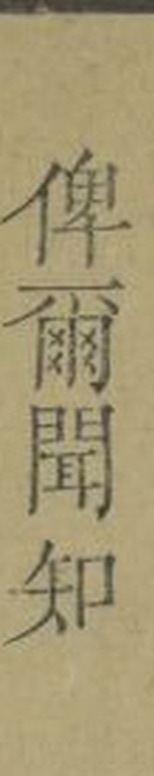俾爾聞知
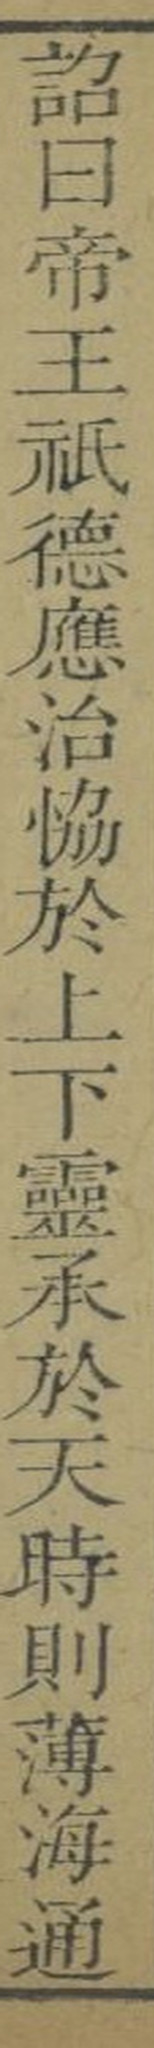詔曰帝王祇徳応治恊於上下霊承於天時則薄海通
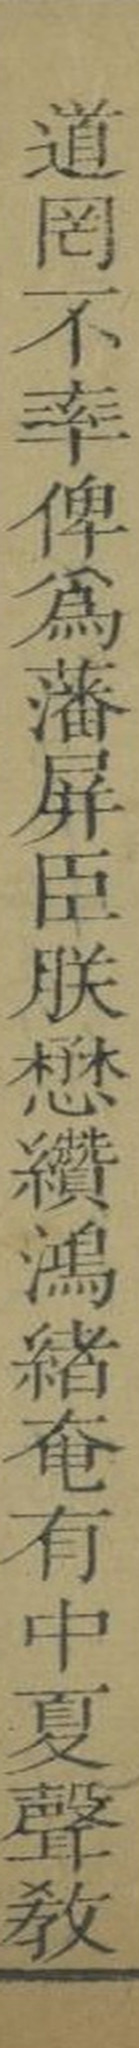道罔不率俾為藩屏臣朕懋纘鴻緒奄有中夏声教
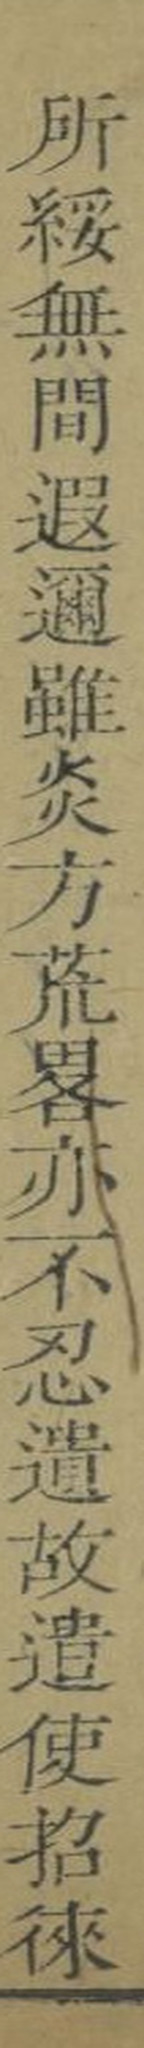所綏無間遐邇雖炎方荒略亦不忍遺故遣使招徠
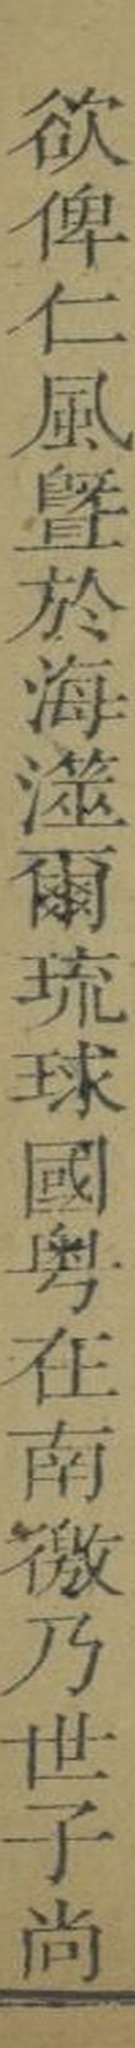欲俾仁風曁於海澨爾琉球国粤在南徼乃世子尚
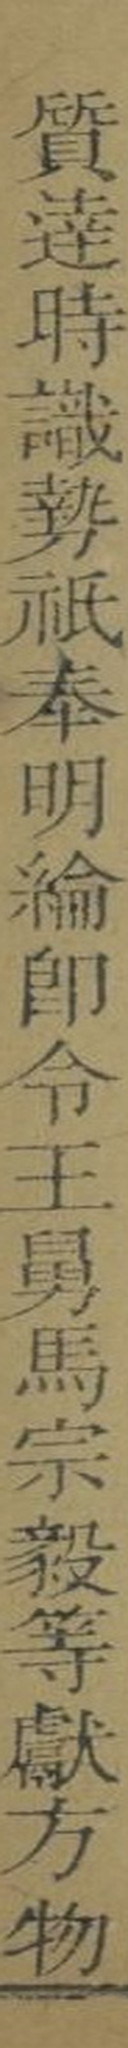質達時識勢祇奉明綸即令王舅馬宗毅等献方物

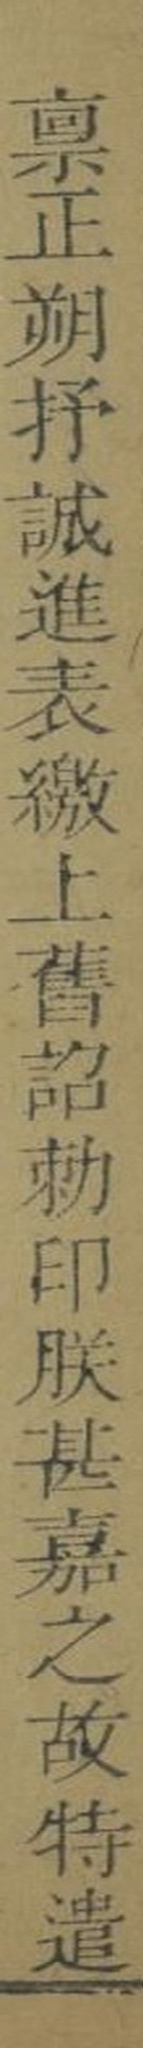稟正朔抒誠進表繳上旧詔勅印朕甚嘉之故特遣
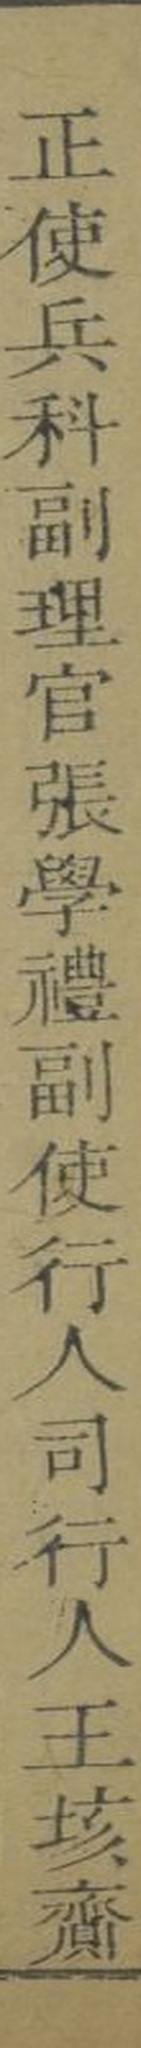正使兵科副理官張学礼副使行人司行人王垓齎
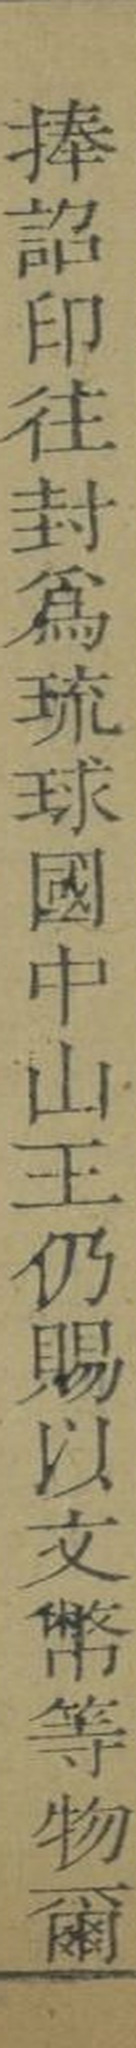捧詔印往封為琉球国中山王仍賜以文幣等物爾
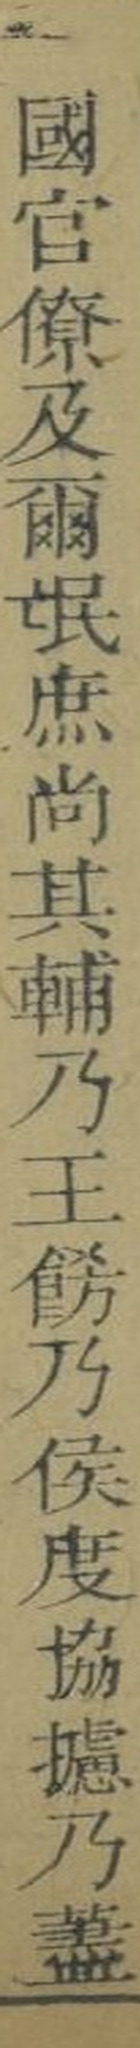国官僚及爾氓庶尚其輔乃王飾乃侯度協攄乃藎
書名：中山伝信録 巻四
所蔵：University of the Ryukyus Library
